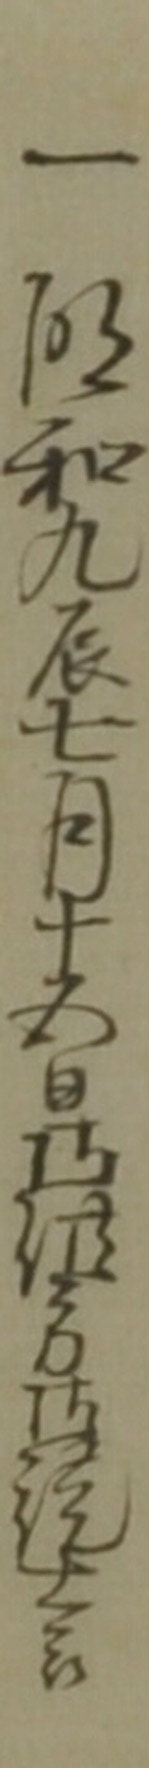一明和九辰七月十五日御供方御徒士被
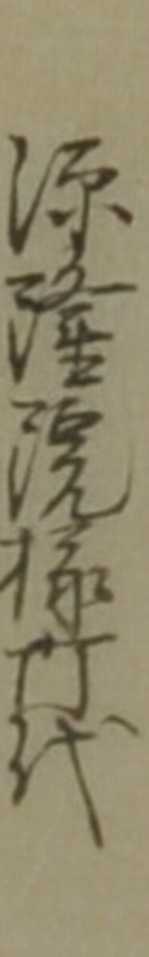源隆院様御代
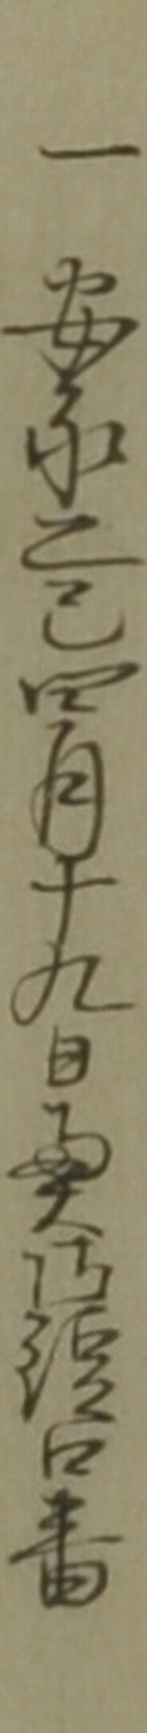一安永二巳四月十九日奥御錠口番
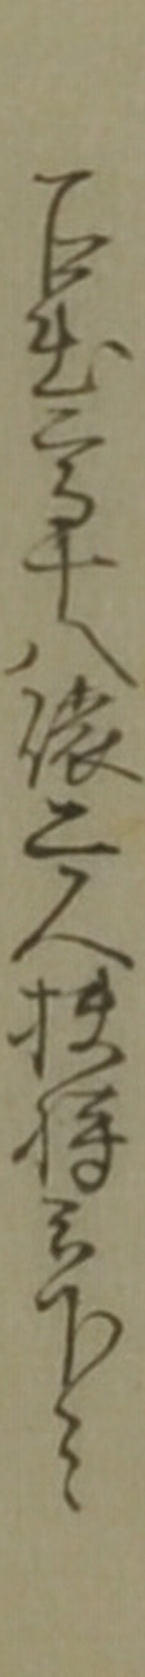召出高十八俵二人扶持被下之
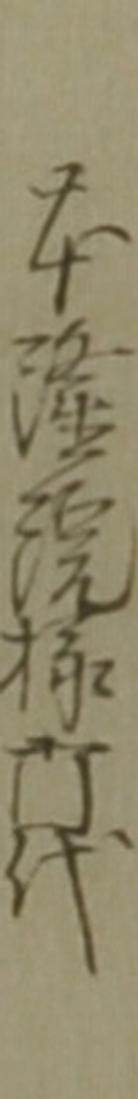本隆院様御代
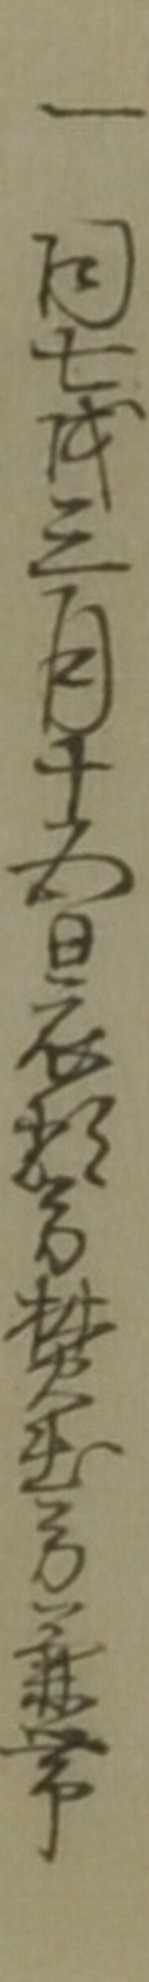一同七戌三月十五日衣類方焚出方兼帯
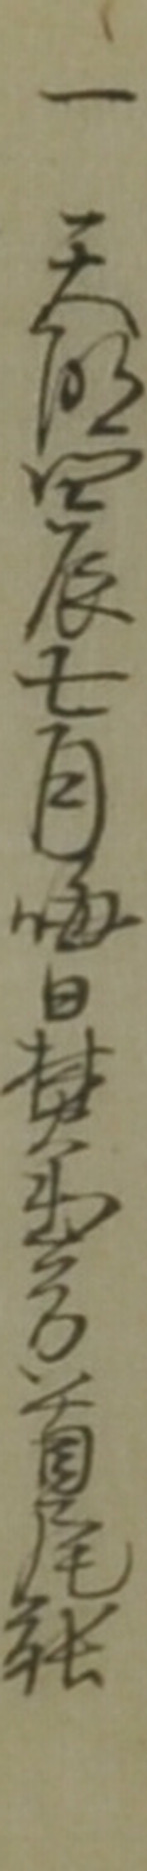一天明四辰七月晦日焚出方首尾能
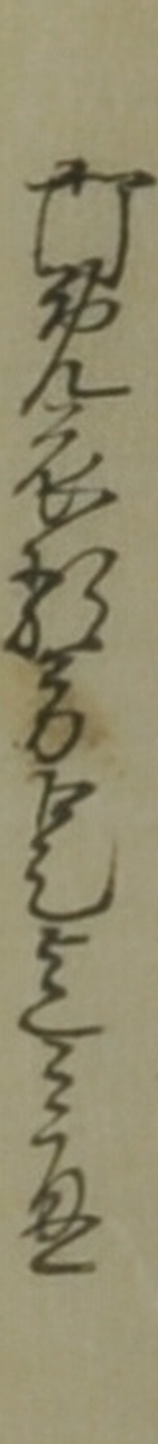御免衣類方是迄之通
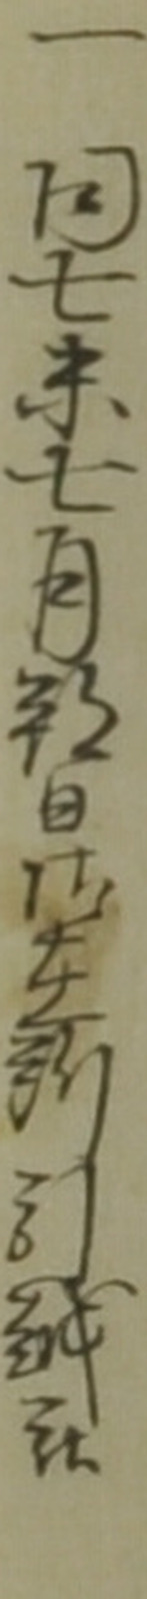一同七未七月朔日御在所引越被
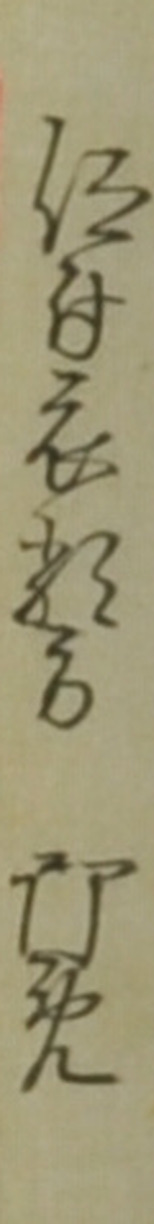仰付衣類方御免

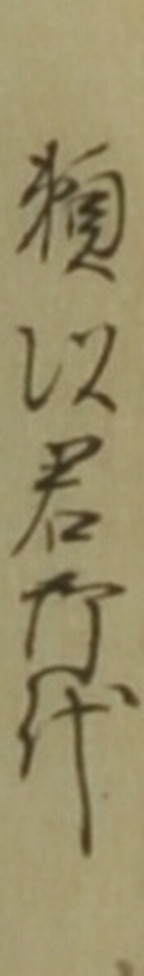頼以君御代
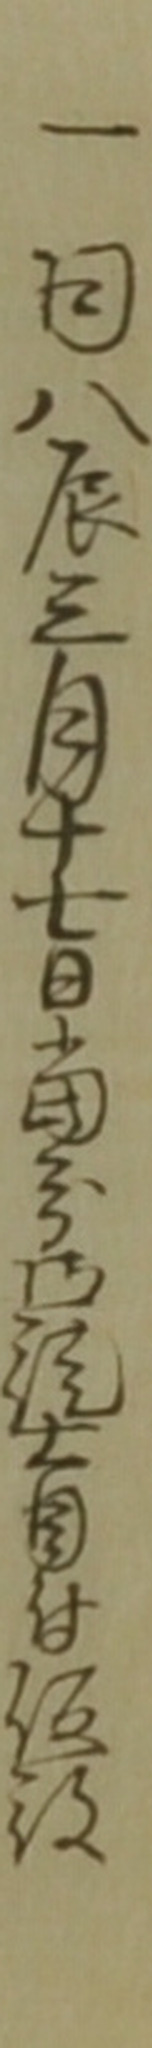一同八辰三月十七日当分御徒士目付仮役
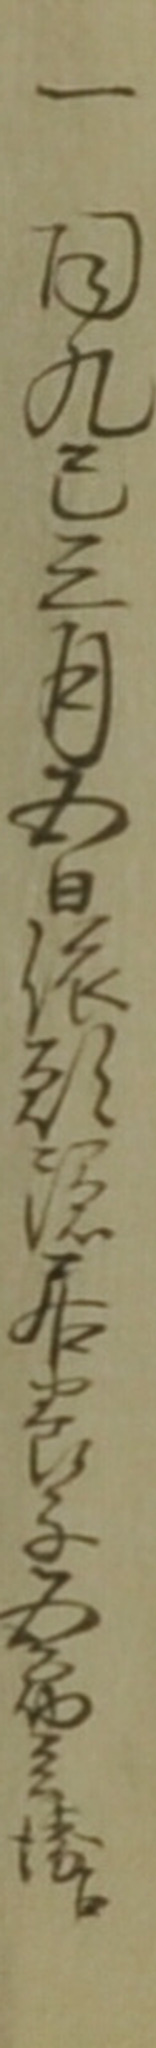一同九巳三月五日依願隠居養子五郎兵衛江
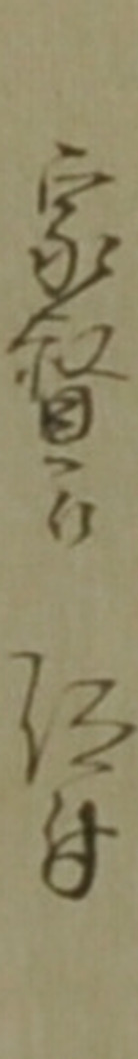家督被仰付
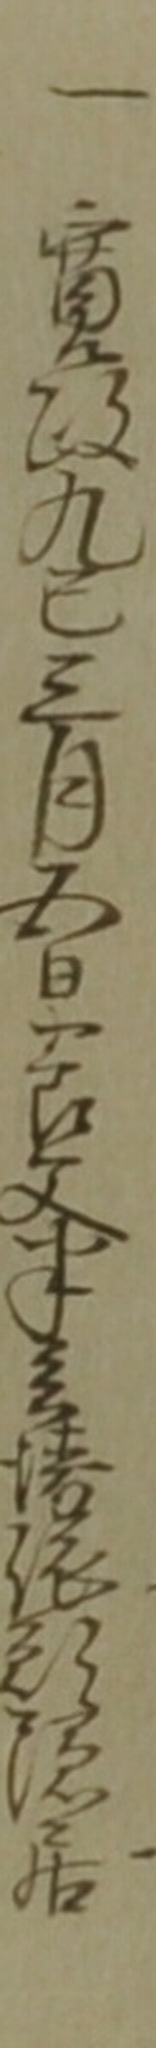一寛政九巳三月五日養父半兵衛依願隠居
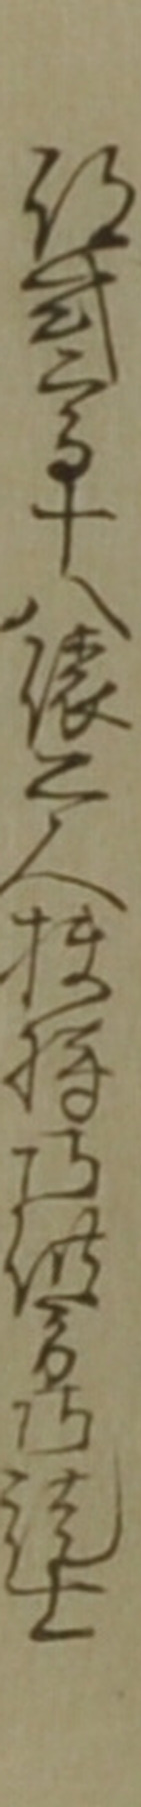跡式高十八俵二人扶持御供方御徒士
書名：無足廃家（壱）
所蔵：伊那市立高遠町図書館・合同会社AMANE
